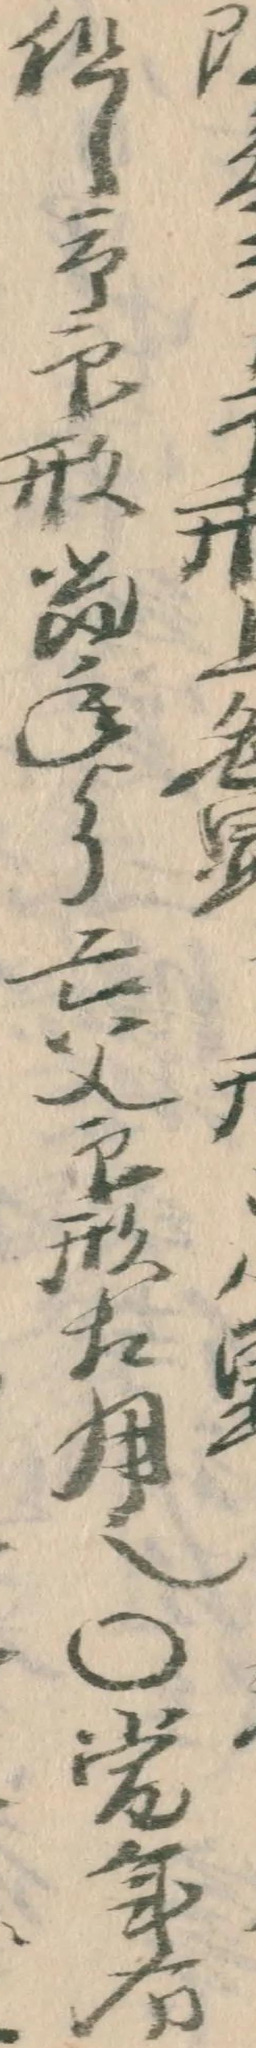但し予印形當年より亡父印形相用也○當年分
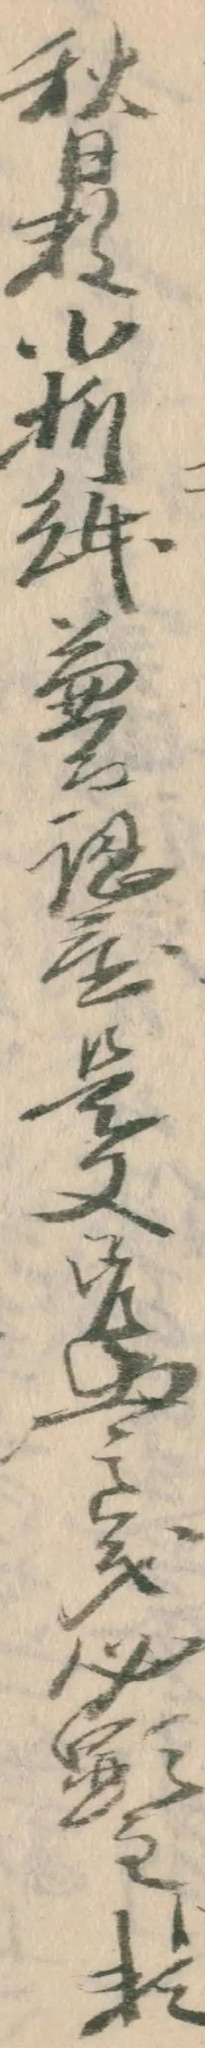秋日数小折紙兼而認置是又差出之義必顕主ト頼
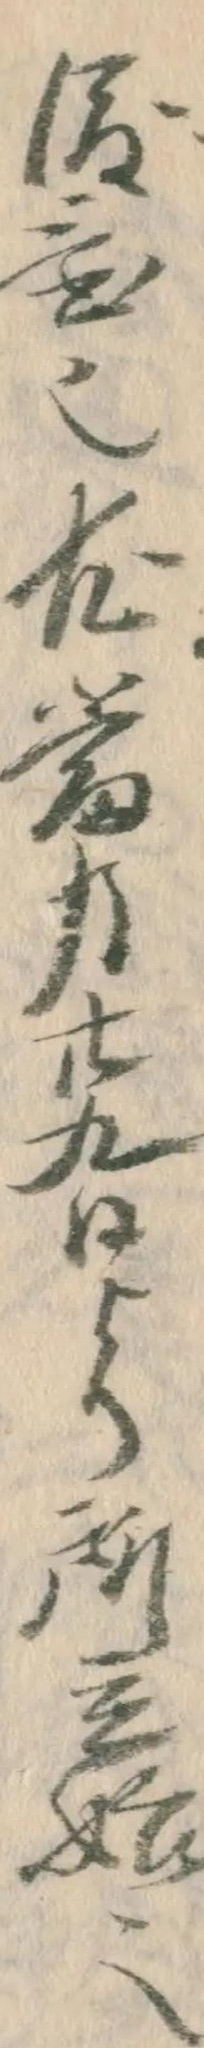渡置也尤當月廿九日より所立始也
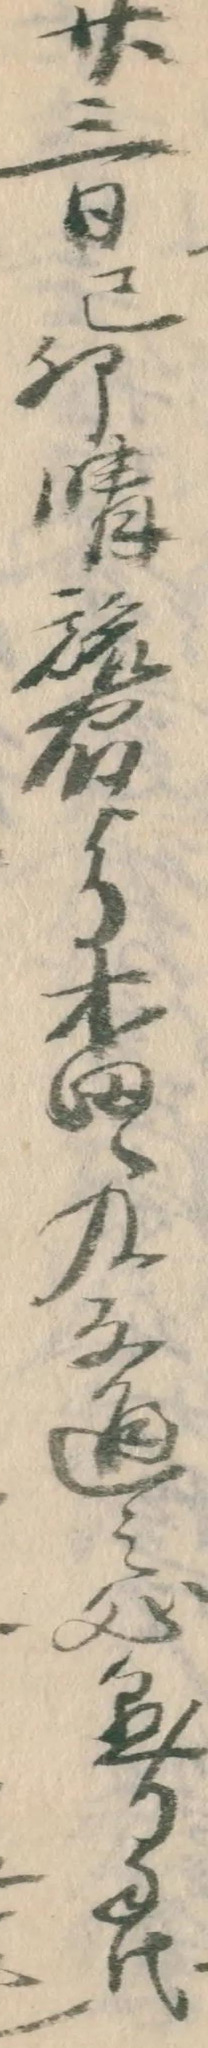廿三日己卯晴旅宿より木田へ及交通之処懸り手代
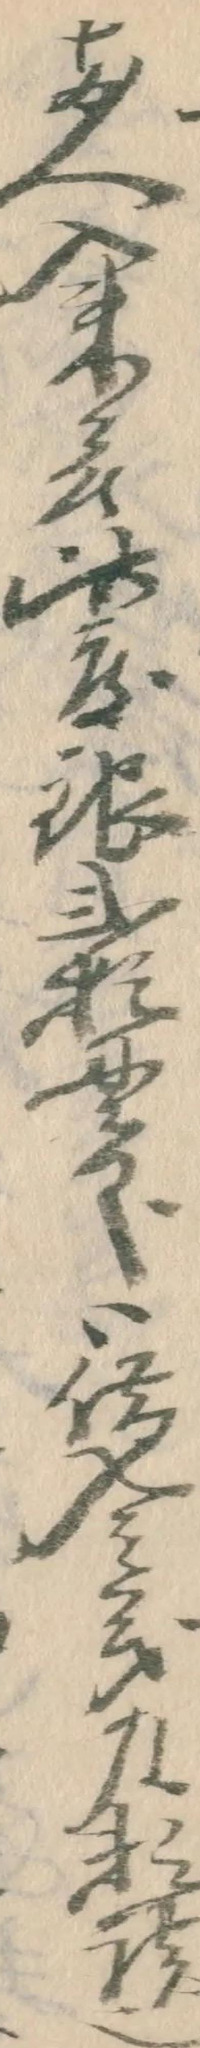両人入来ニ付此度銀弐拾貫匁御借入之義及頼談也
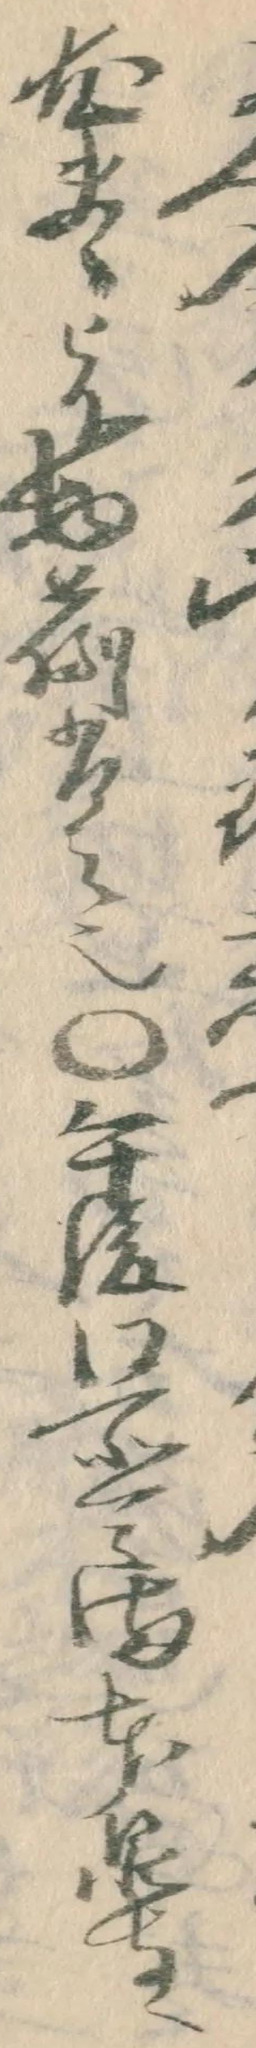尤夫々被下物如例有之也○午後同所満本泉寺へ
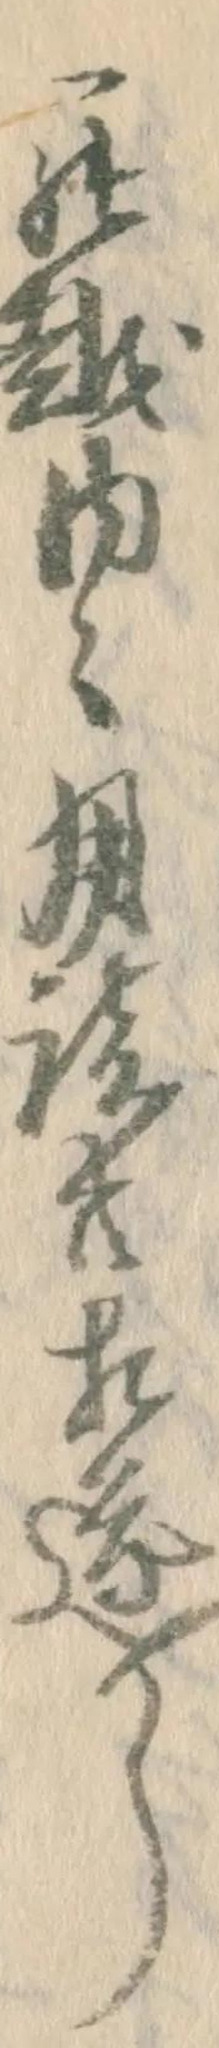罷越内々用談共相遂了
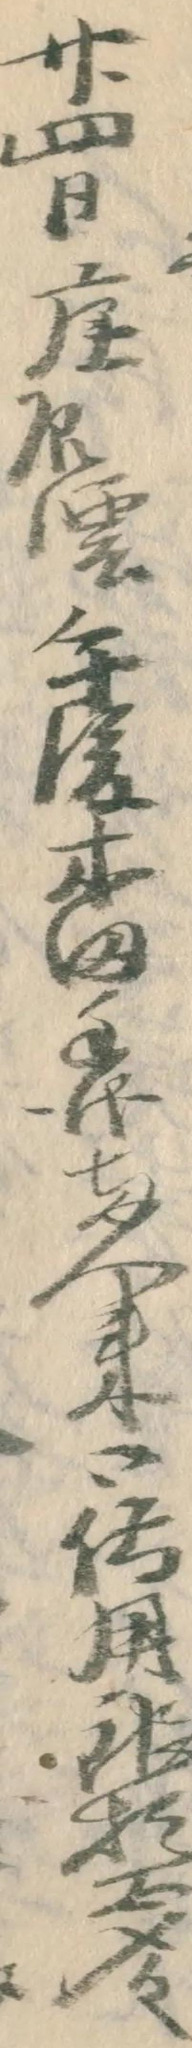廿四日庚辰曇午後木田手代両人来御借用銀拾五匁
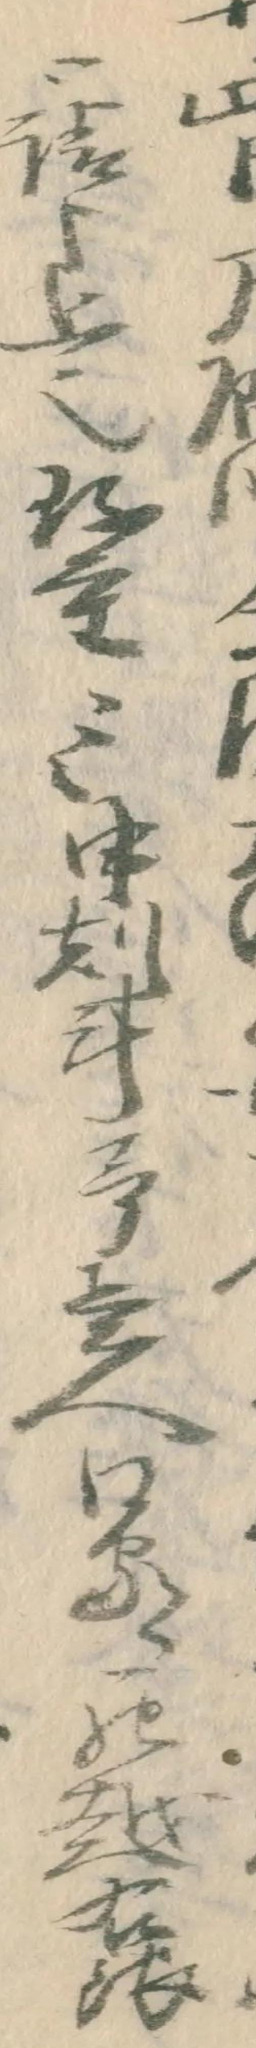御請申上也珍重々々申刻斗予壱人同家へ罷越右銀
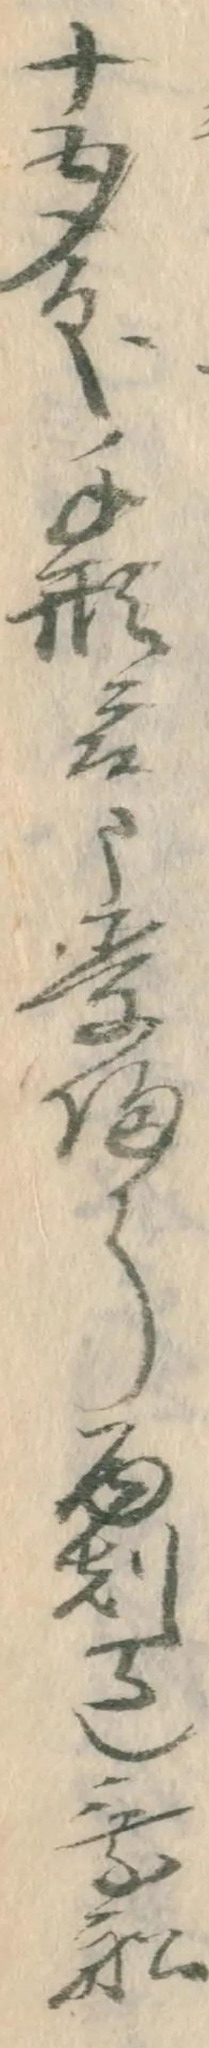十五貫匁手形二而申受帰了酉刻過乗舩

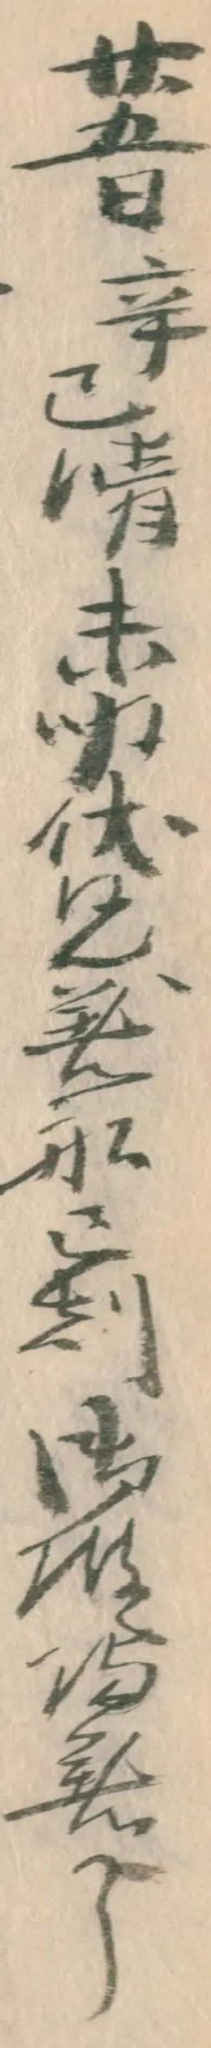廿五日辛巳晴未明伏見着舩巳刻御殿へ帰着了
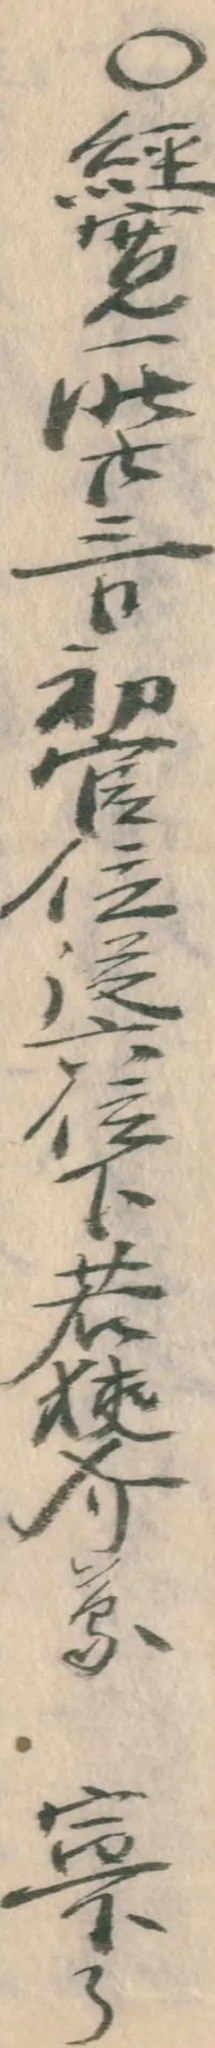○経寛一昨廿三日初官位従六位下若狭介蒙宣下了
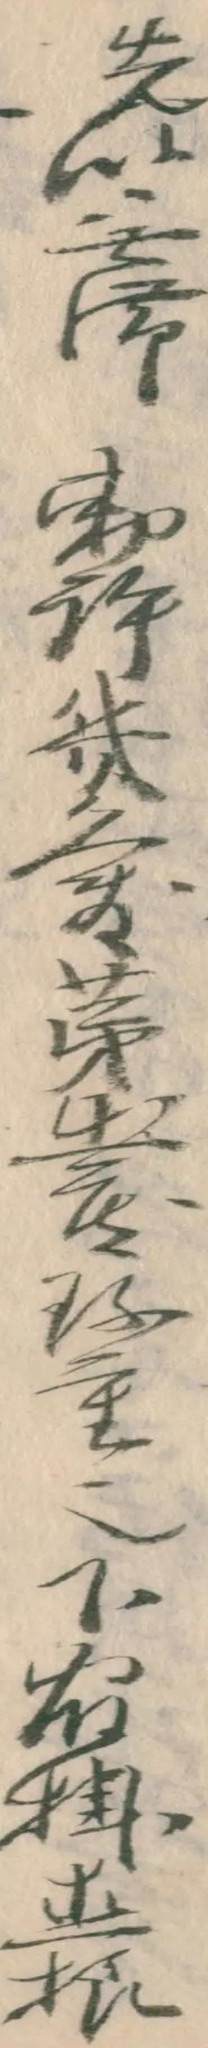先般無滞勅許幾久敷芽出度珍重也下宿掛直様
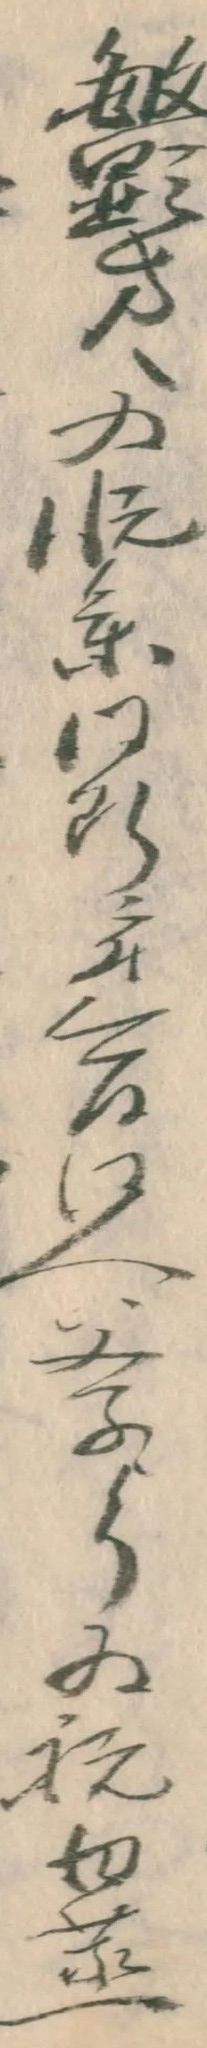敏顕方へ為祝参同断ニ付今日同人父子より為祝白蒸
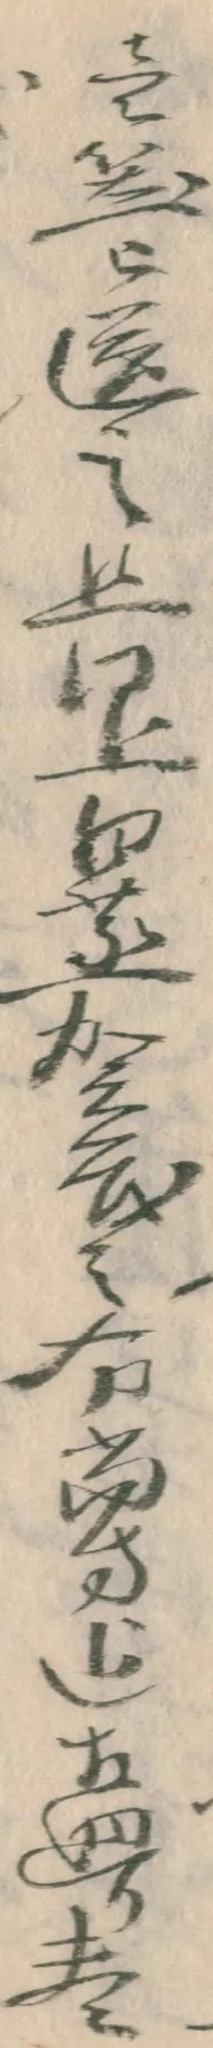壱器被送之且同上白蒸賀茂之分當方迄相廻り夫々
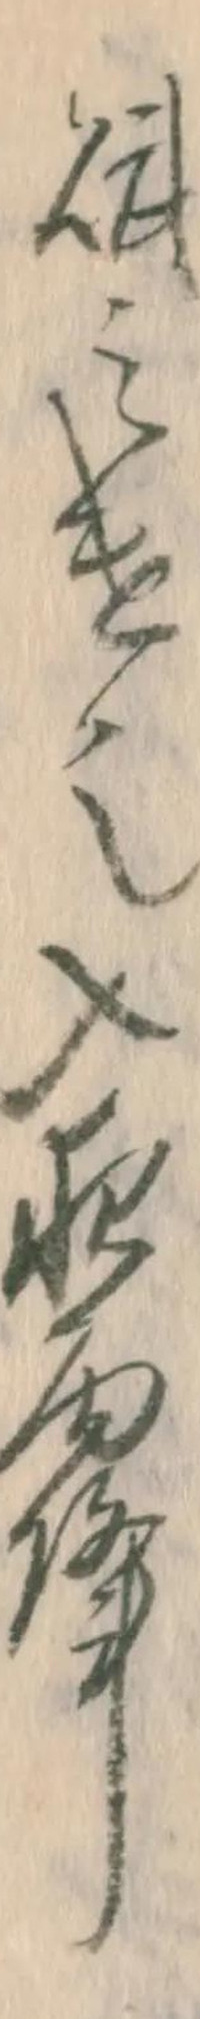賦之遣也入夜雨降
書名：賀茂社記録. 第67冊
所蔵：国立国会図書館 National Diet Library, JAPAN
